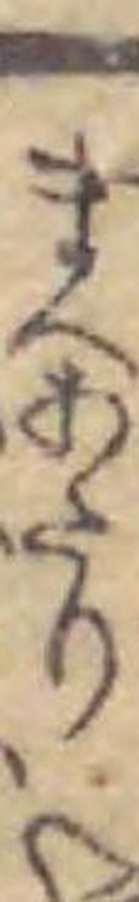まへあたり
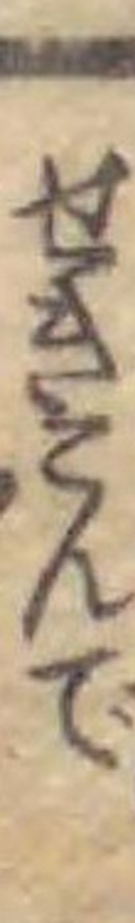せきこんで
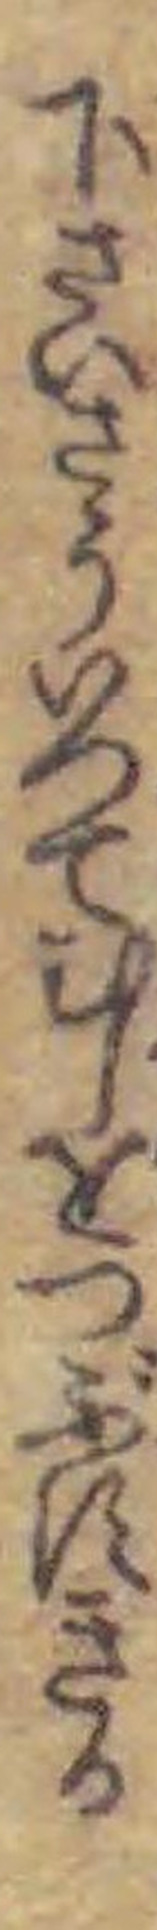下さいさういつてむしをつぶすきか

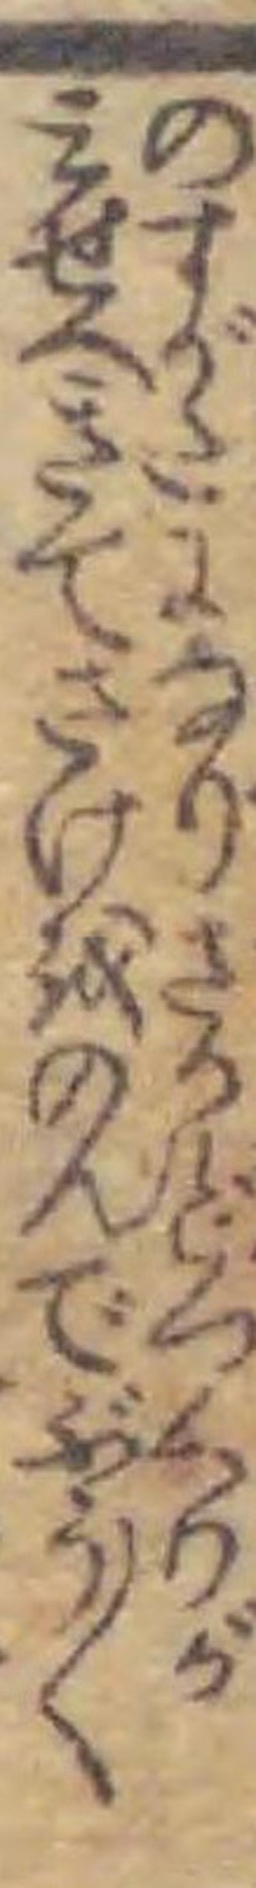みせへきてさけをのんでぶう〳〵
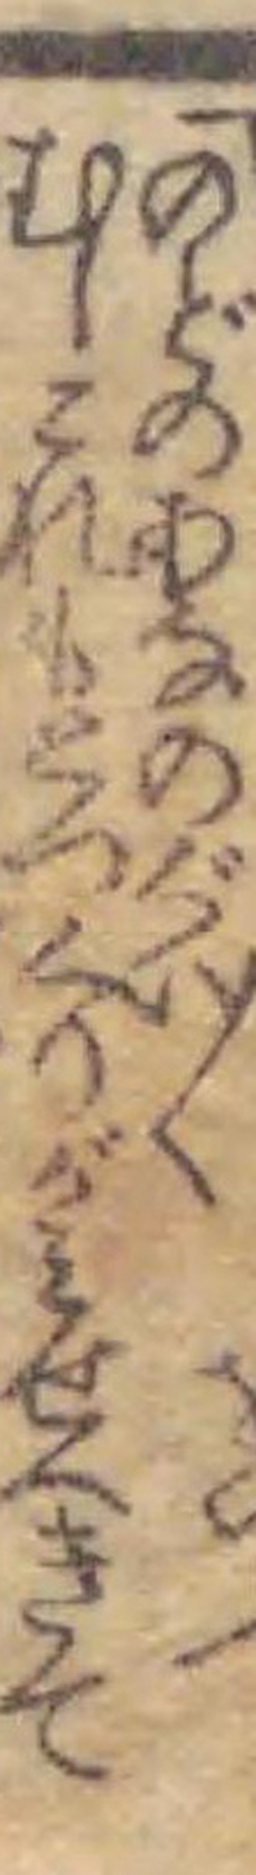むしこれもとつくりがみせへきて
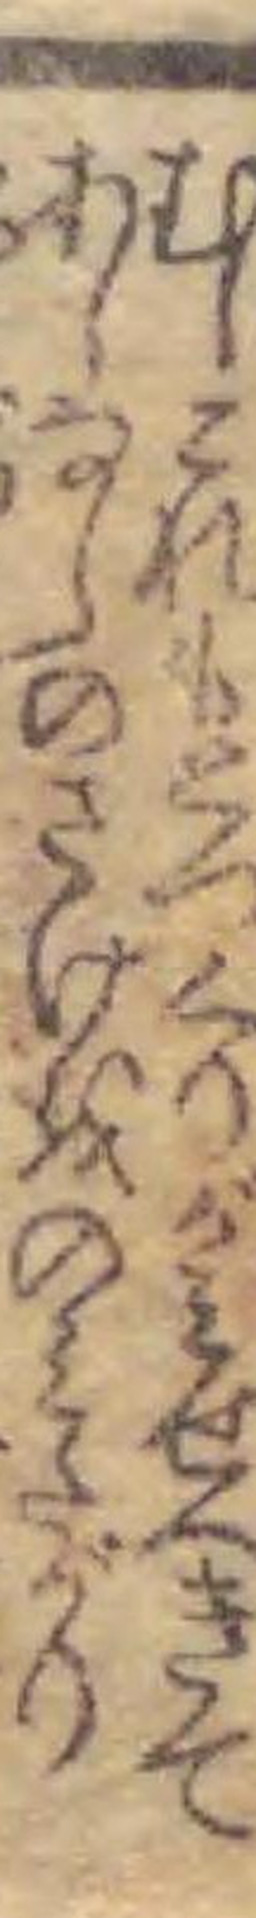あしなしのさけをのみたがり
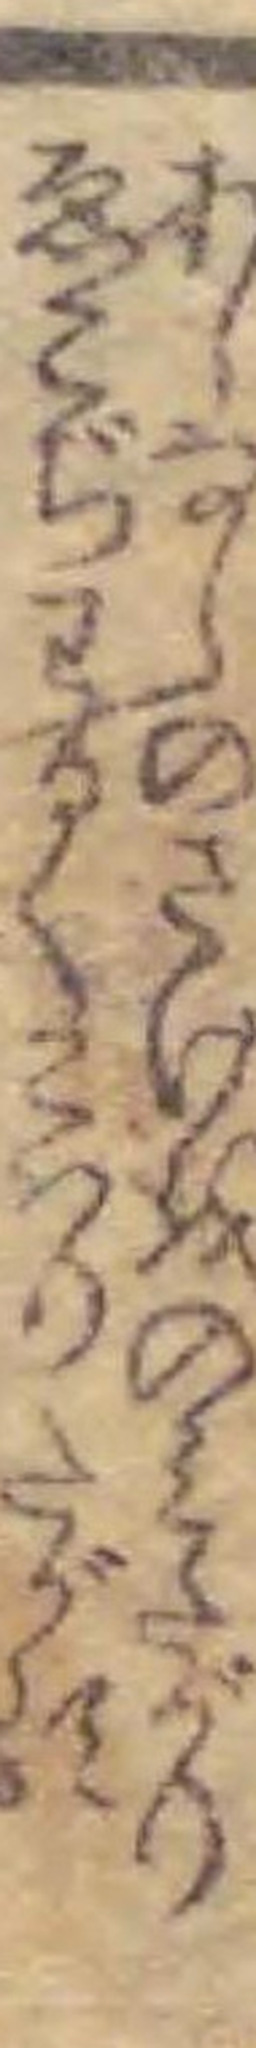ゑこぢわるくこはりたがる
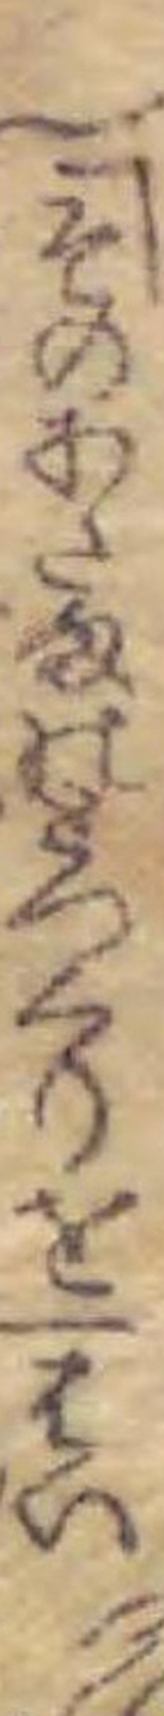〽そのそのあたまのとつくりを一はい
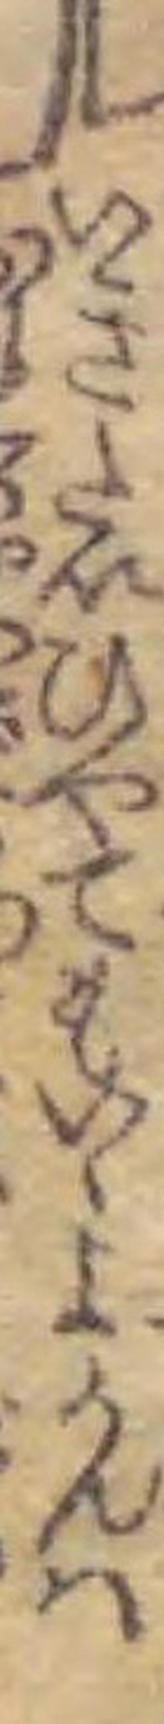いきたいひやてもいゝよかんは
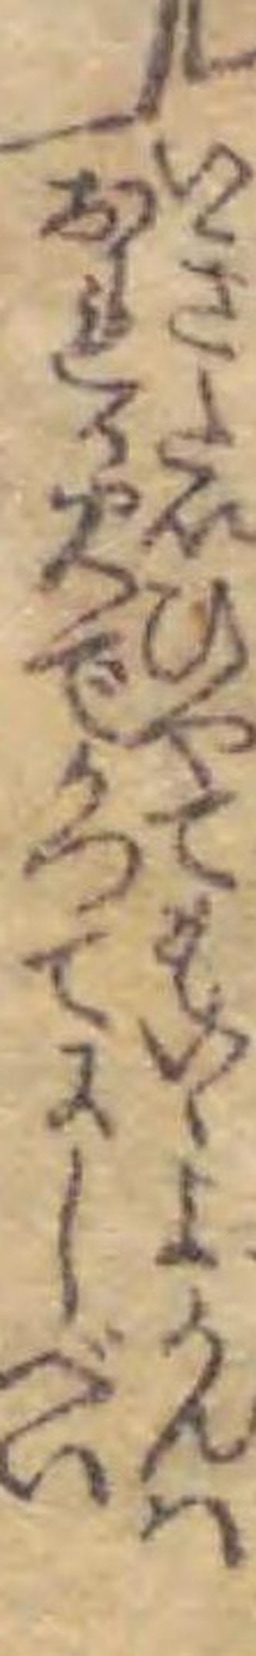おれか火でかつてにしべい
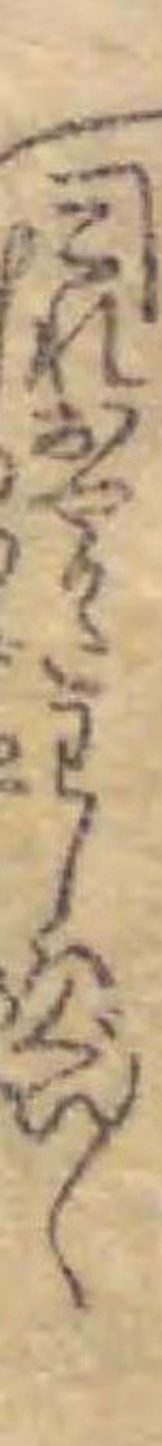〽これおやかたわしはぐい〳〵
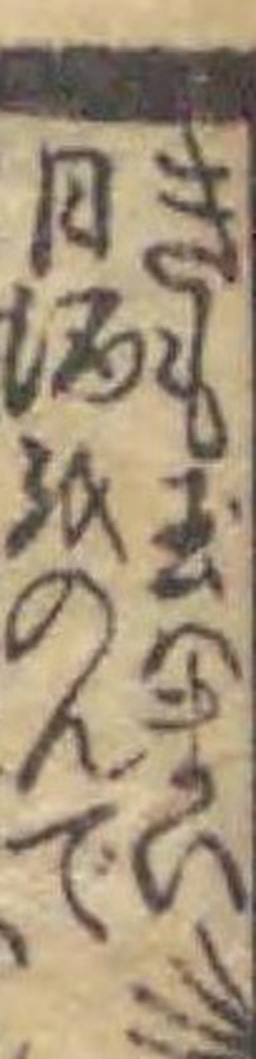日酒をのんで
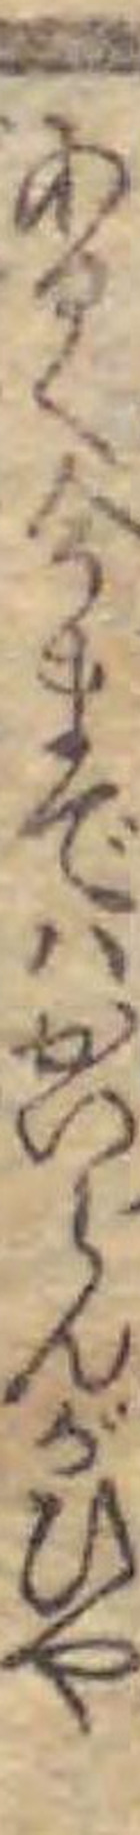あるく今まではかいらんがひや
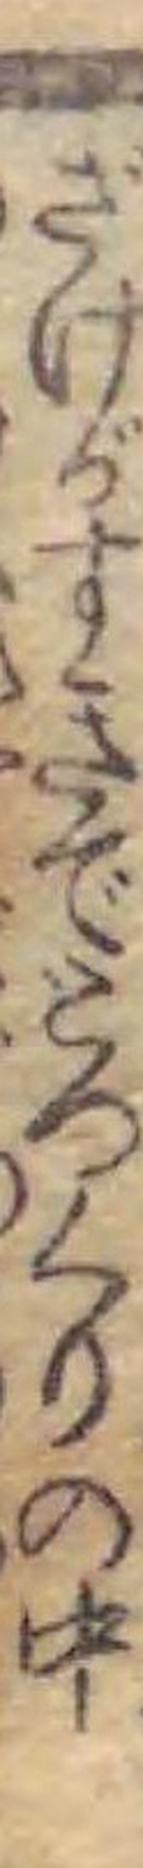ざけがすきでとつくりの中
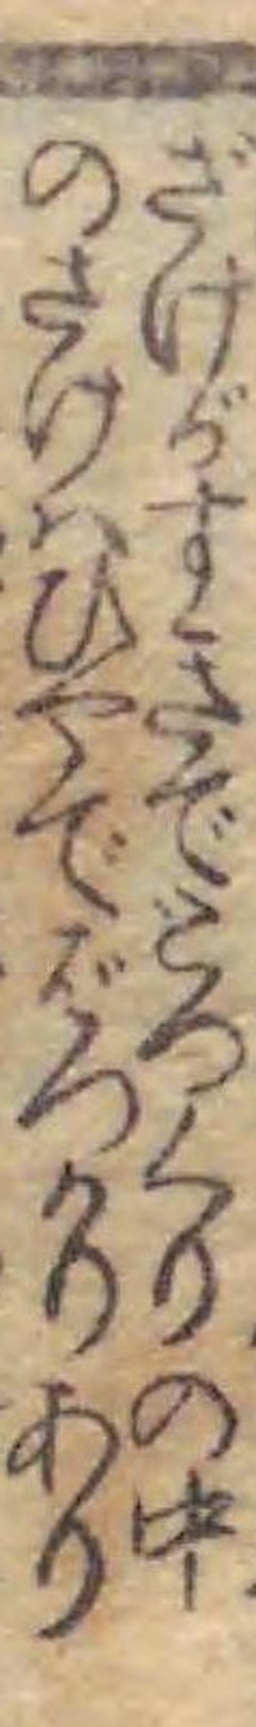のさけはひやでばつかりあり
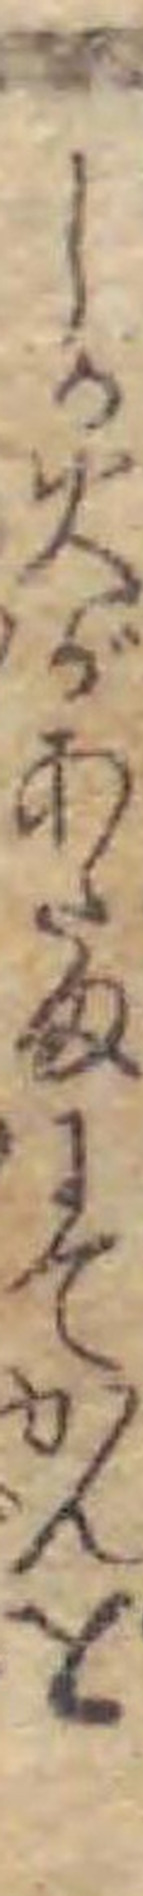しか火があたまにてかんを
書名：十四傾城腹之内 : 3巻
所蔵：国立国会図書館 National Diet Library, JAPAN
